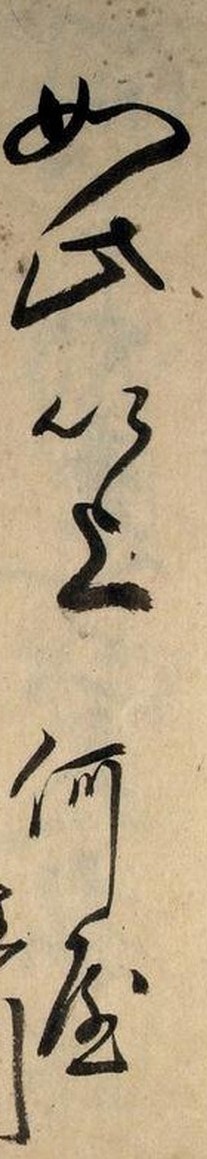如此以上何屋
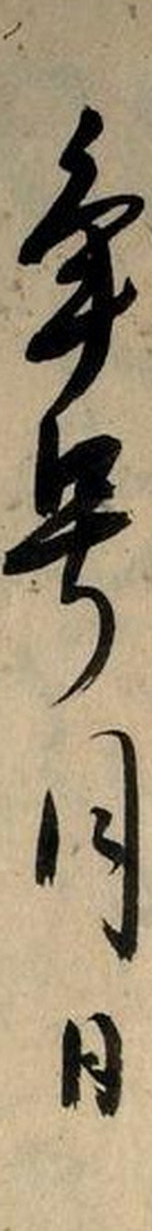年号月日
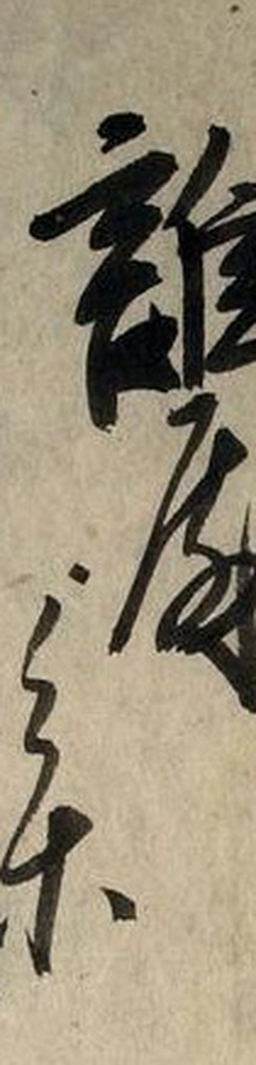市兵衛
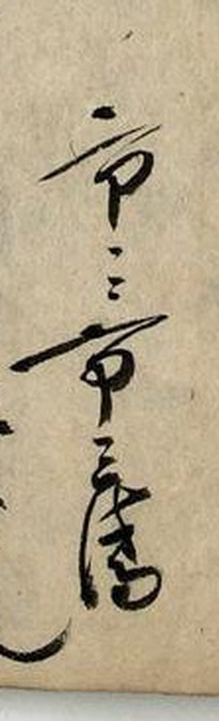市兵市兵衛
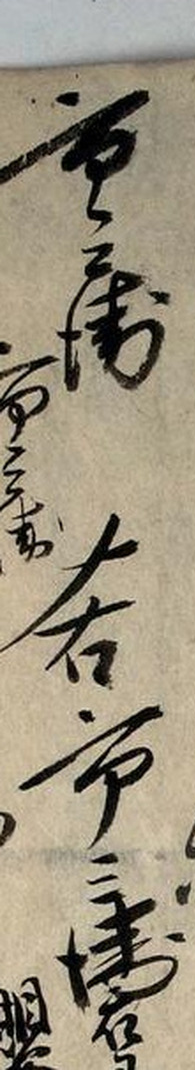市兵衛桜井市兵衛
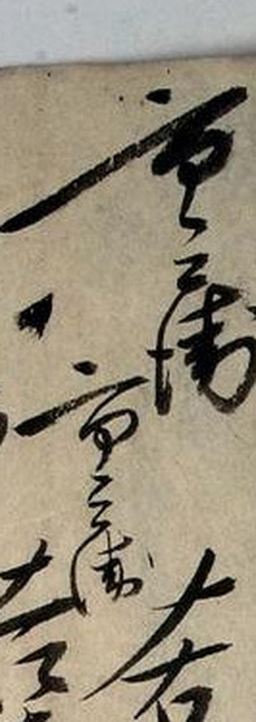市兵衛
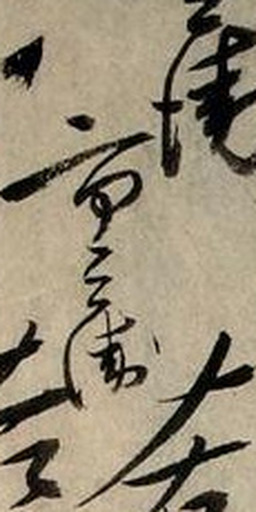市兵衛
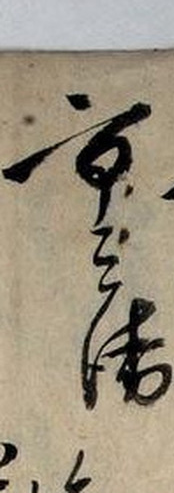市兵衛
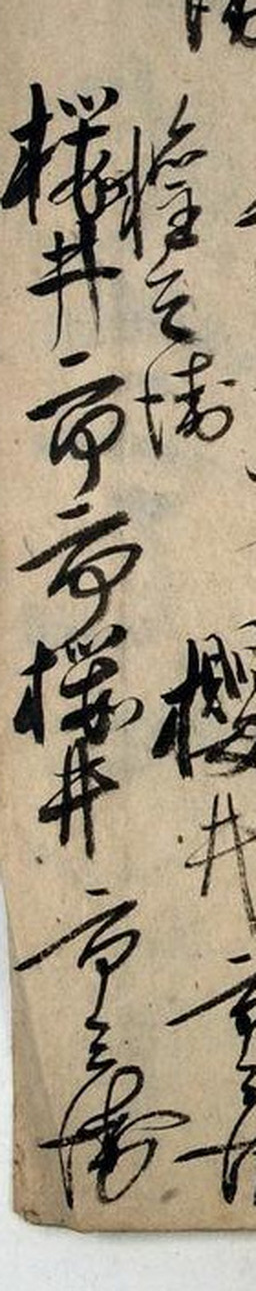桜井市市桜井市兵衛

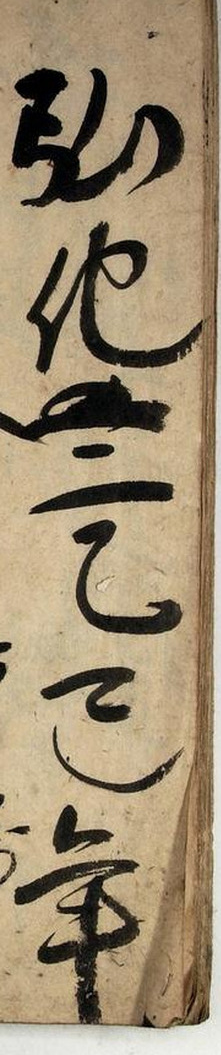弘化二乙巳年
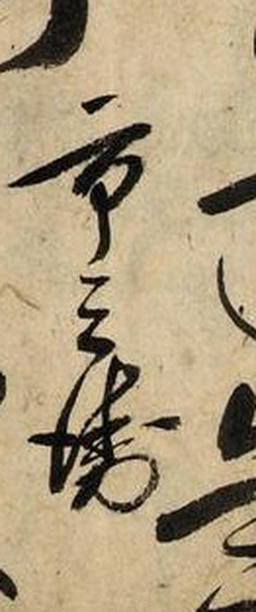市兵衛
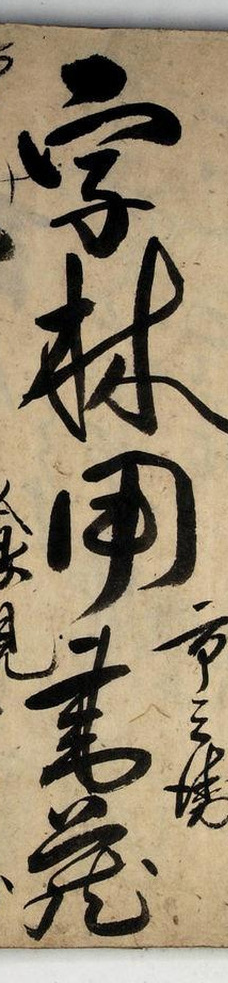字林用書蔵
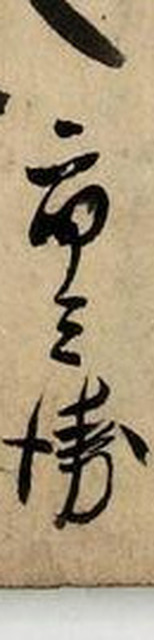市兵衛
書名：御手本（手習、預リ申銀子之事、売渡申家屋敷事ほか）
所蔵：福井県文書館 Fukui Prefectural Archives
